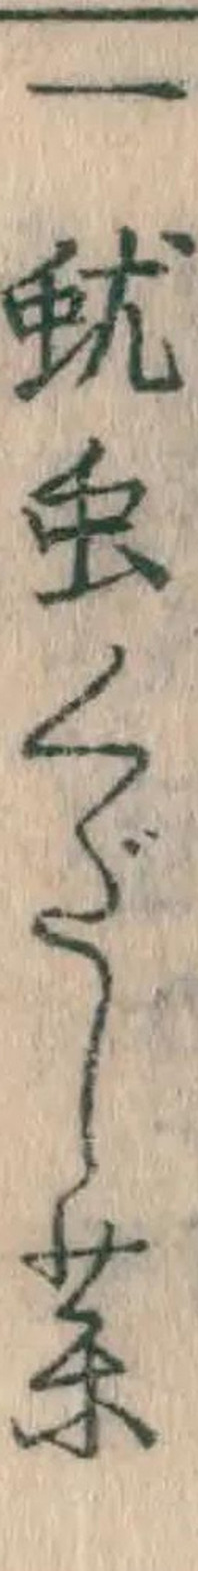一蚘虫くだし薬
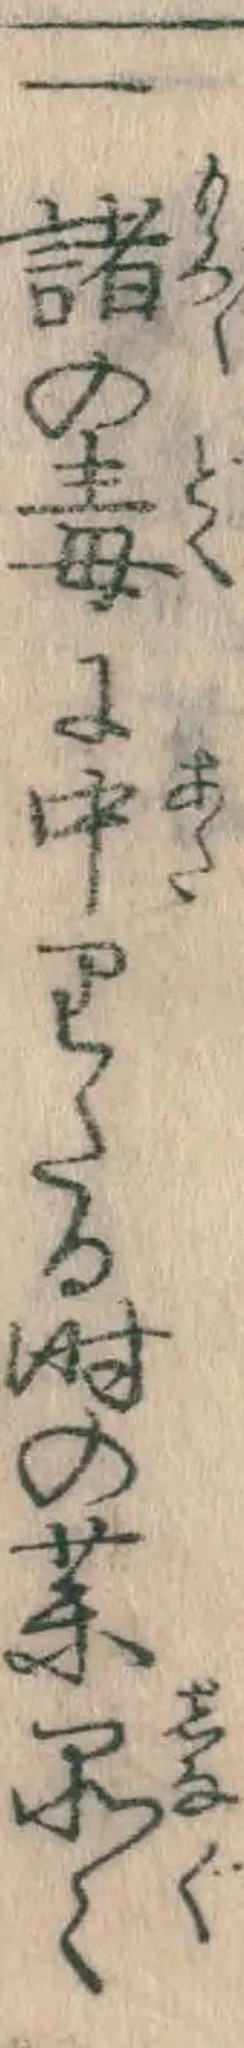一諸の毒に中りたる時の薬品々
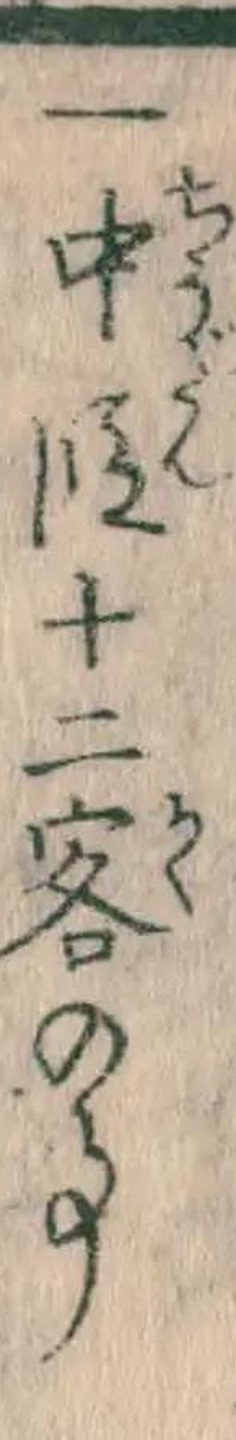一中段十二客の事
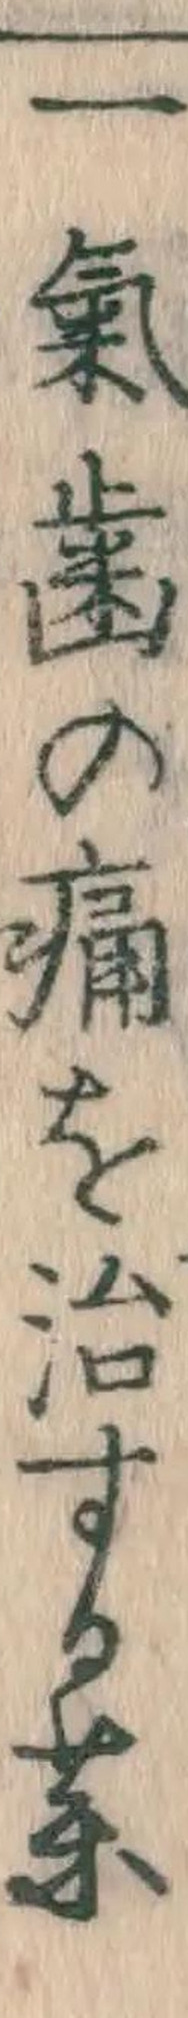一気歯の痛を治する薬
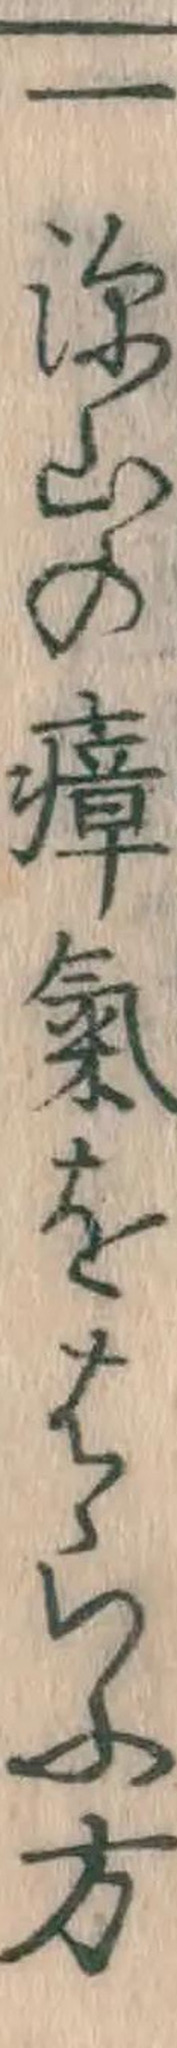一深山の瘴気をはらふ方
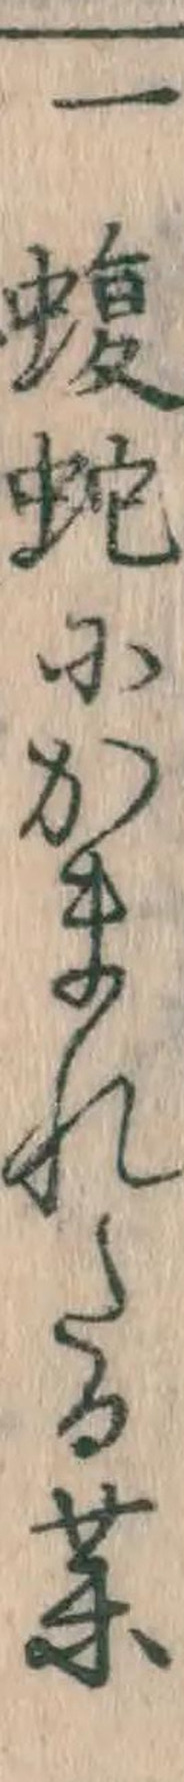一病狗にかまれたる薬
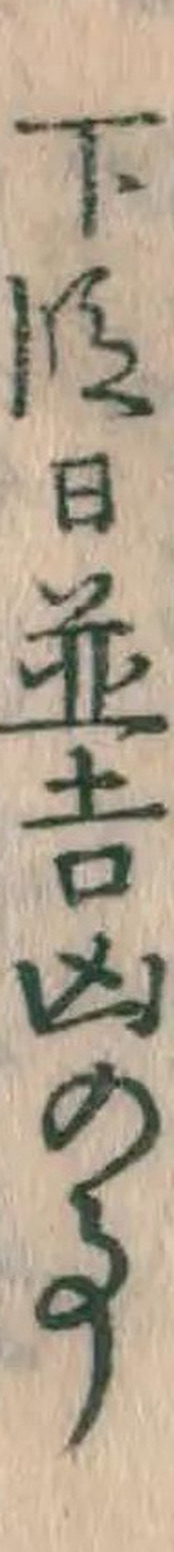一下段日並吉凶の事
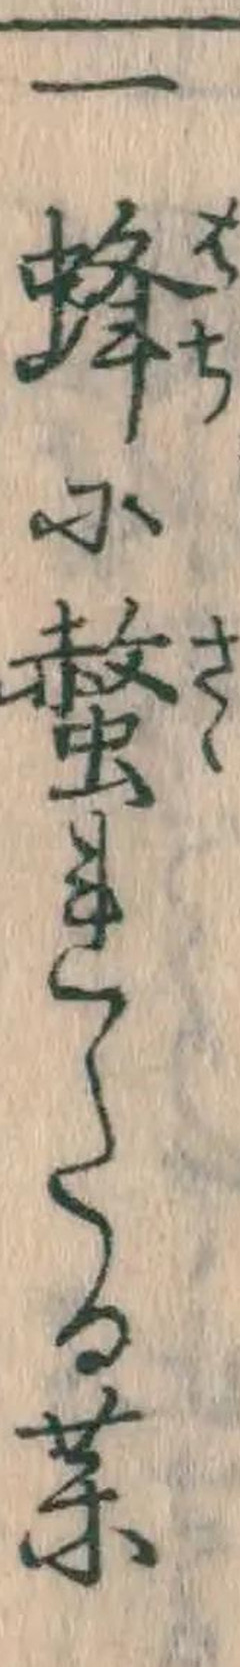一蜂に螫れたる薬
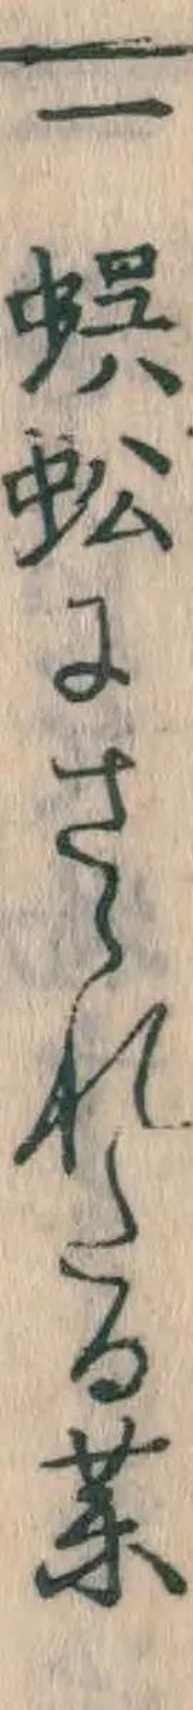一蜈蚣にさゝれたる薬
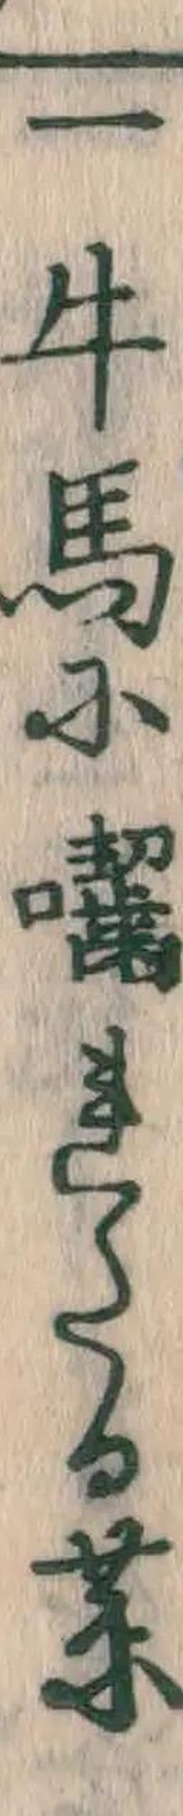一牛馬に囓れたる薬
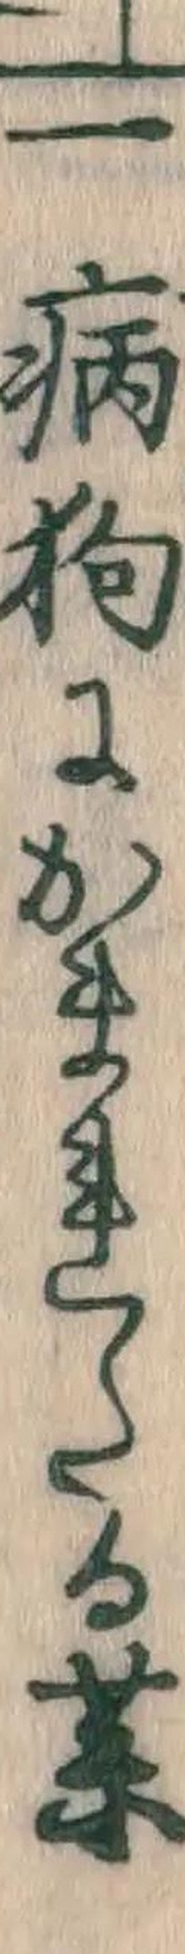一病狗にかまれたる薬
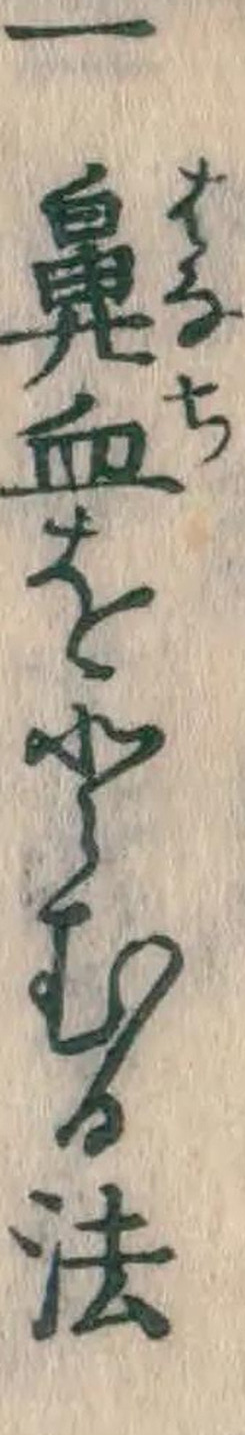一鼻血をとむる法
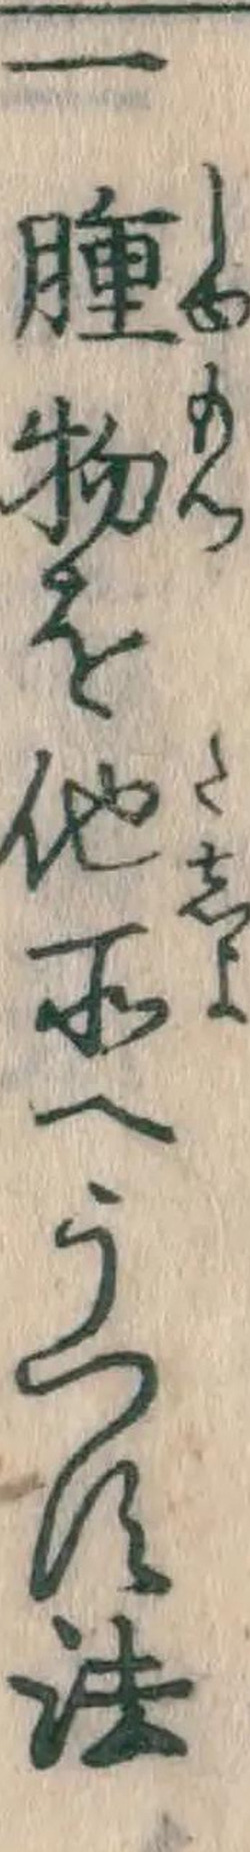一腫物を他所へうつす法
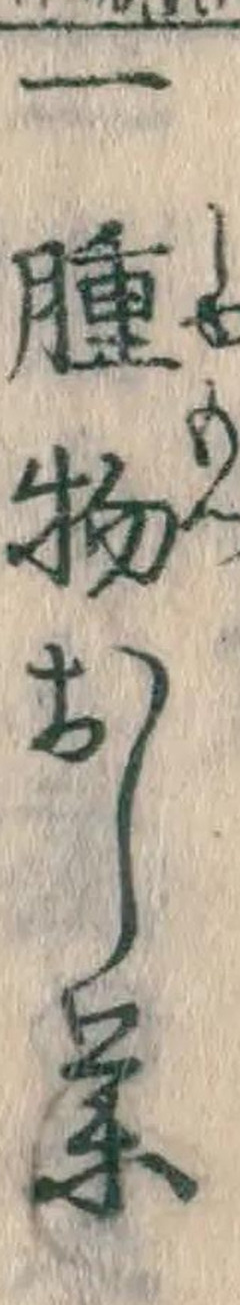一腫物おし薬
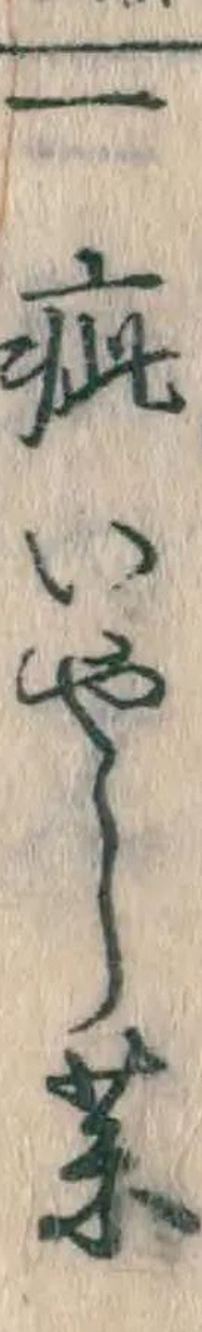一疵いやし薬
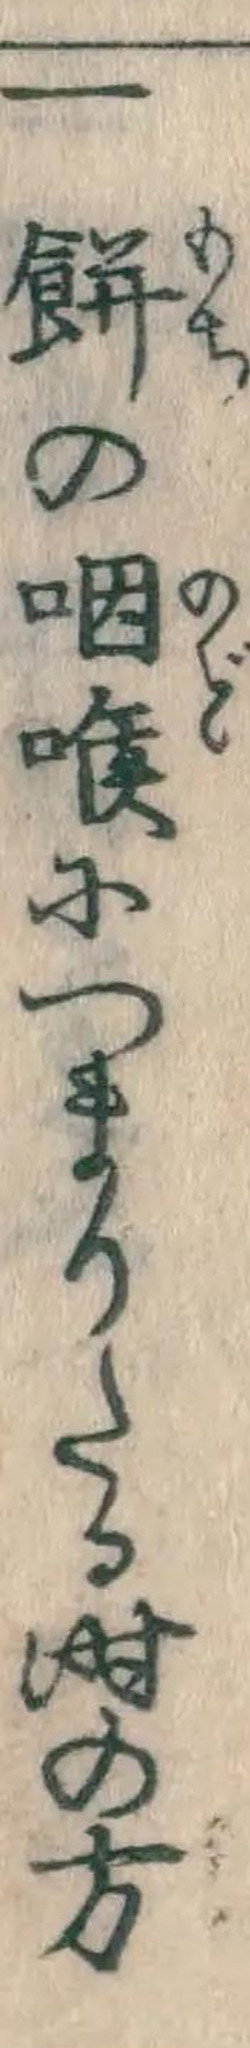一餅の咽喉につまりたる時の方
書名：広益秘事大全 3巻. [1]
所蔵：国立国会図書館 National Diet Library, JAPAN
